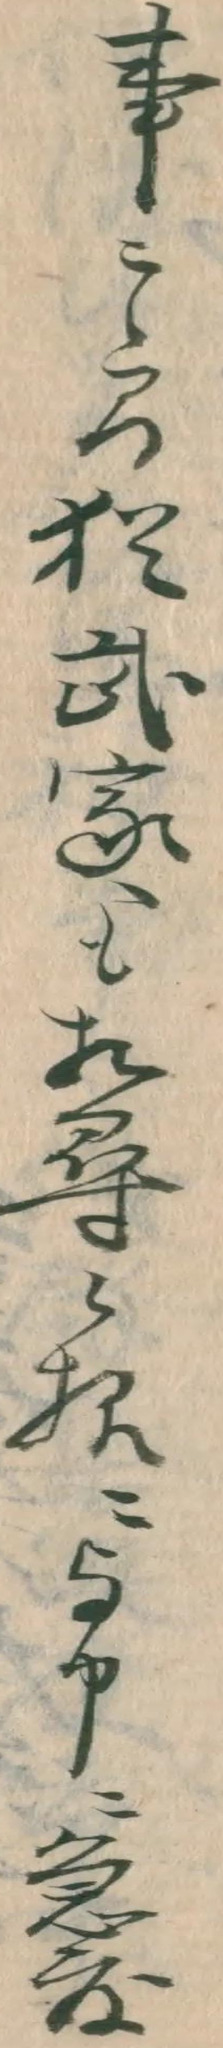事ニ候間猶武家へも相尋候様ニ与申ニ急度
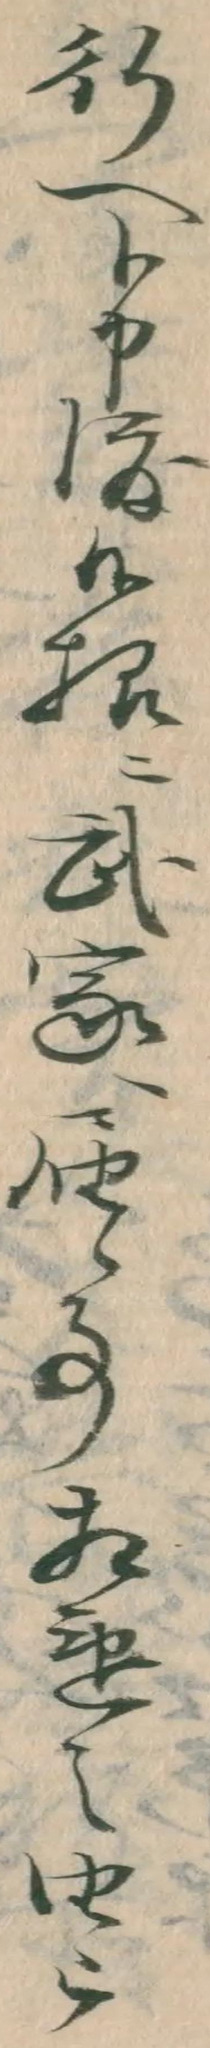行へト申渡候様二武家へ届候事相違之由被
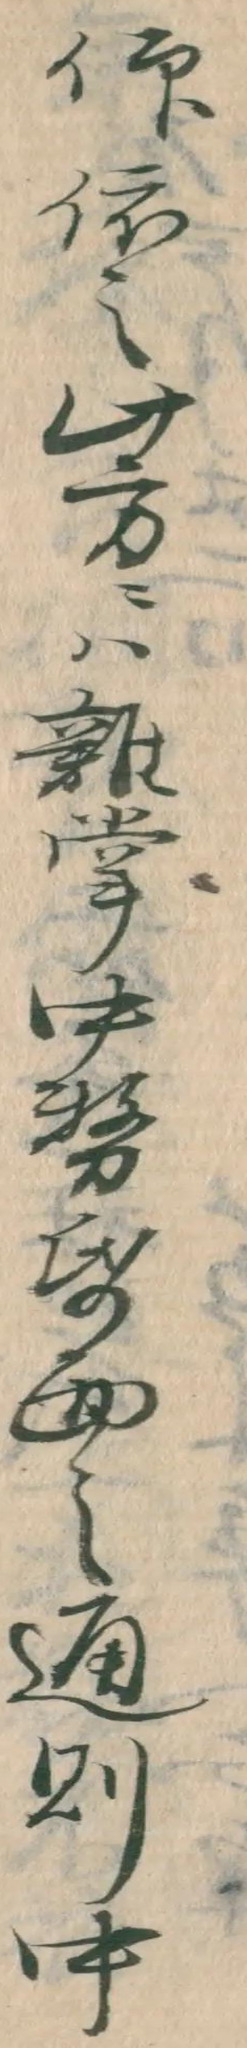仰依之此方ニハ雑掌中務帋面之通則中
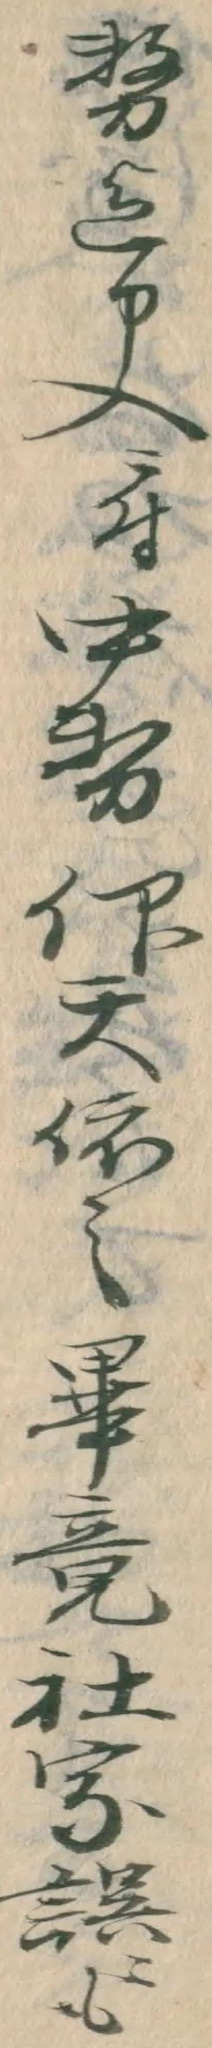務迄申入ニ付中務仰天依之畢竟社家誤ニも
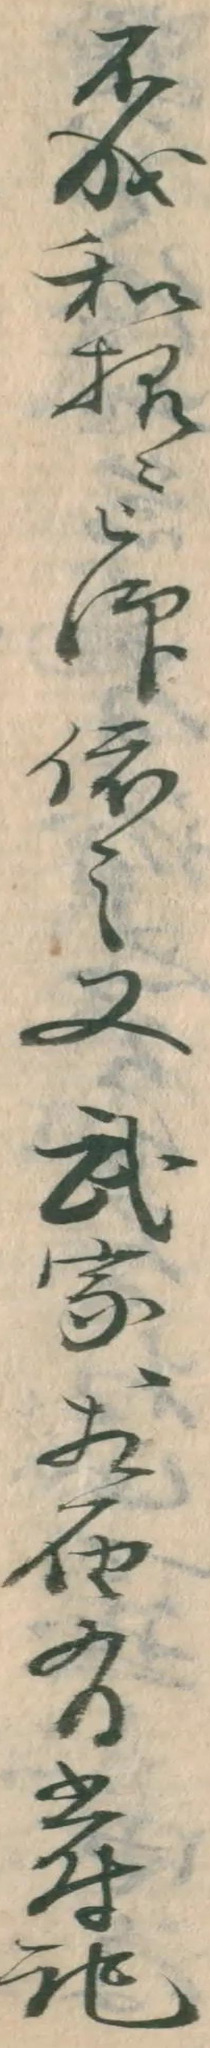不成和様ニ被仰依之又武家へ相届有書付記
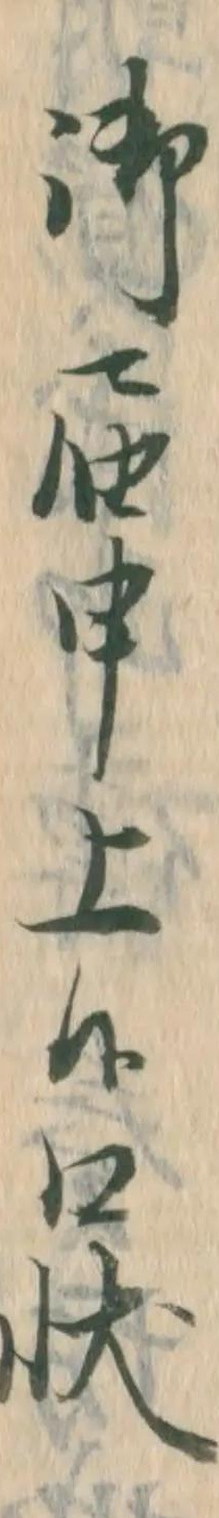御届申上候口状

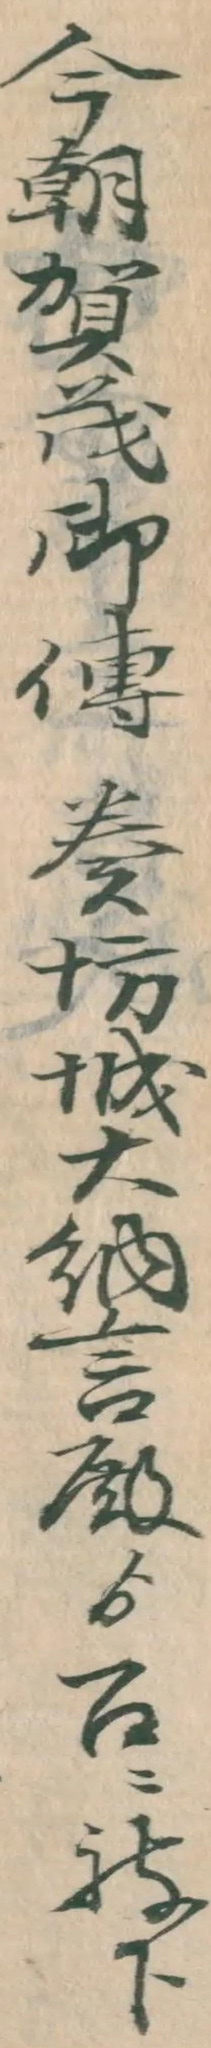今朝賀茂御伝奏坊城大納言殿ゟ召ニ被下
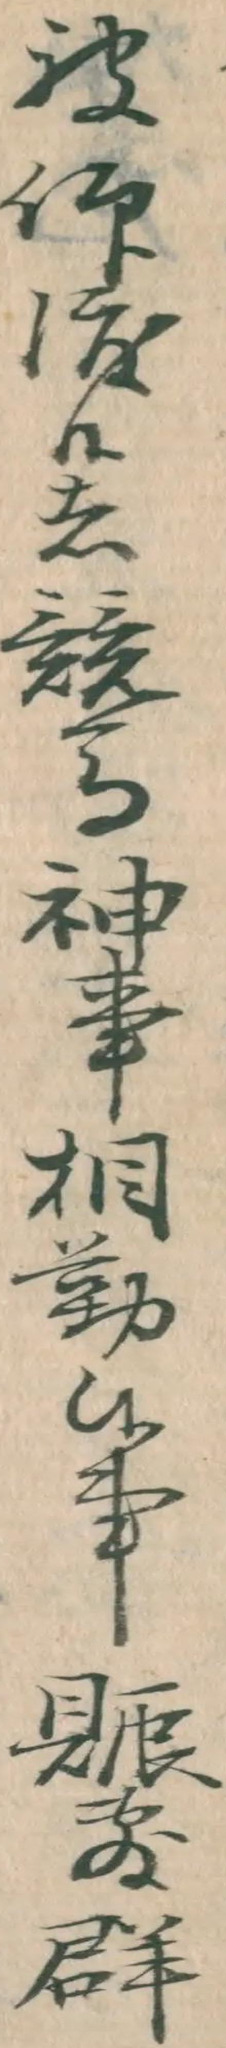被仰渡候者競馬神事相勤候事賑敷群
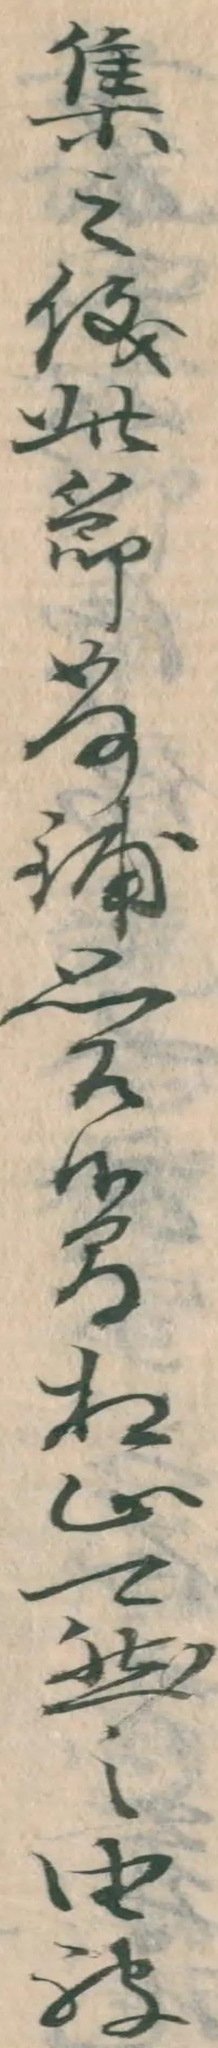集之儀此節如何鋪思召候間相止可然之由被
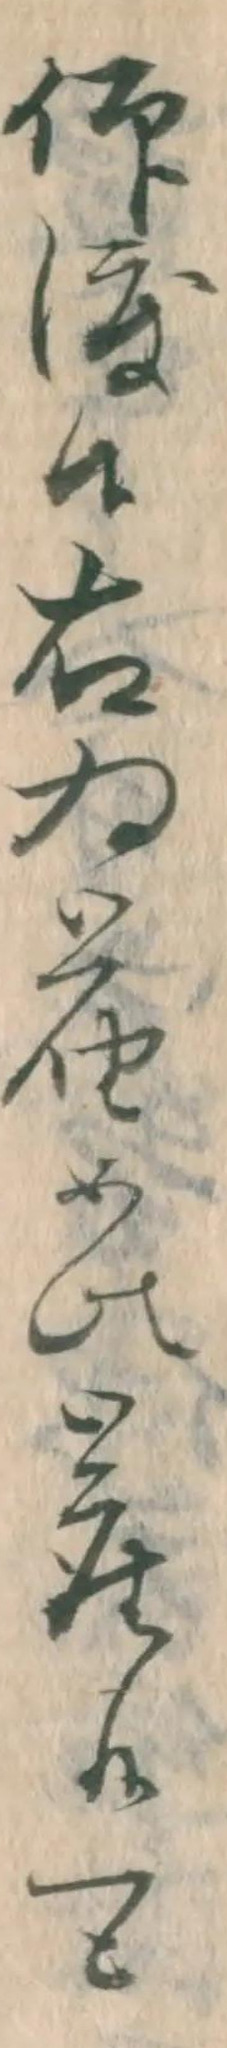仰渡候右為御届如此御座候以上
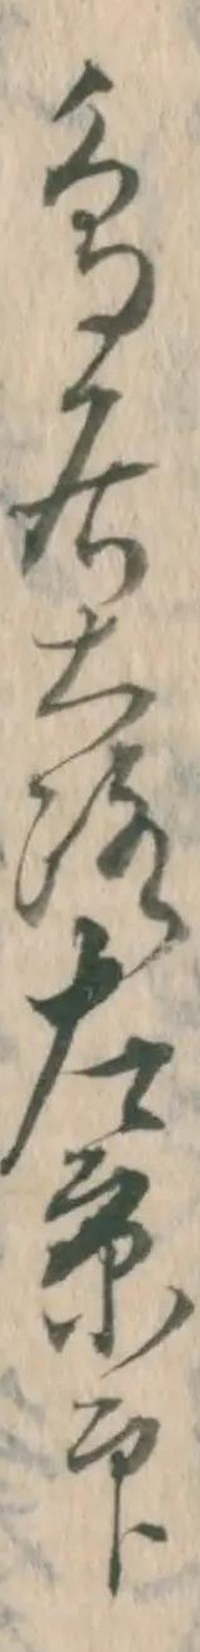鳥居大路左京印
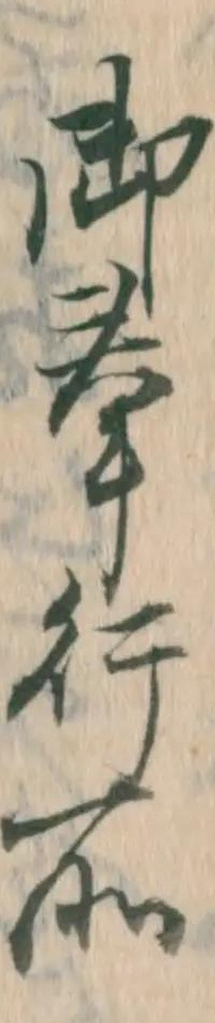御奉行所
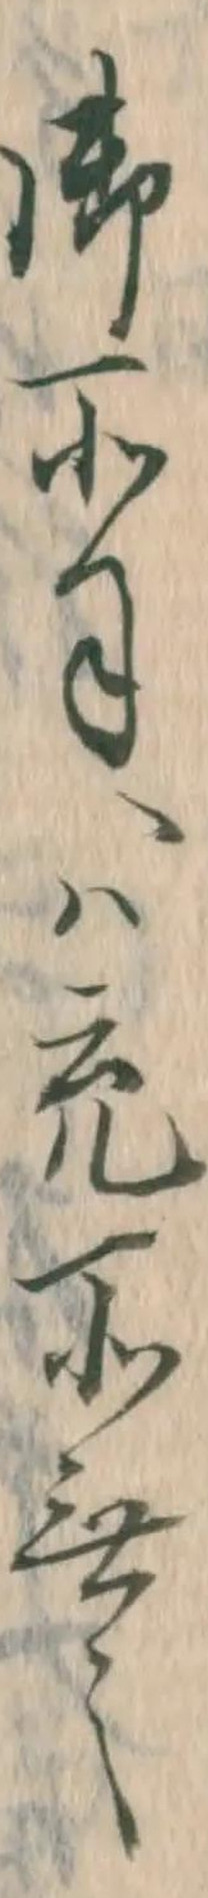御所司へハ充所無之
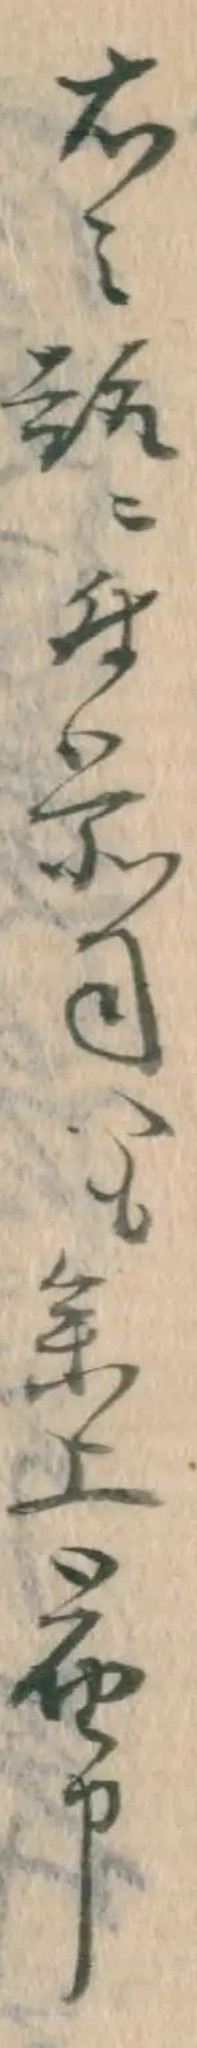右之趣ニ付御所司へも参上御届申候
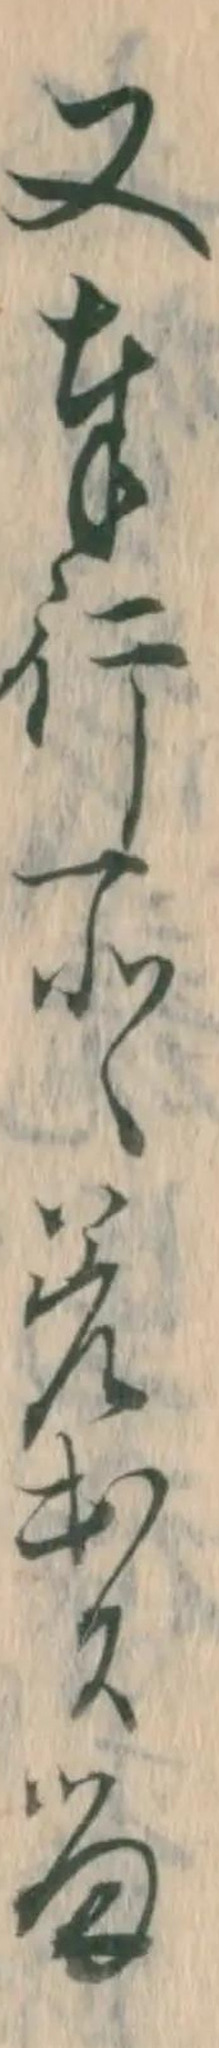又奉行所へ差出ス留
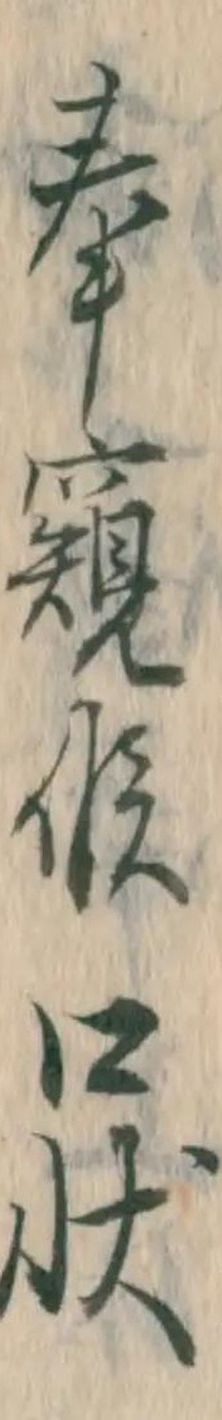奉窺候口状
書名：賀茂社記録. 第10冊
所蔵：国立国会図書館 National Diet Library, JAPAN
